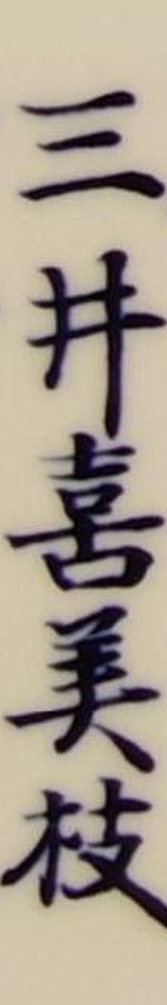三井喜美枝
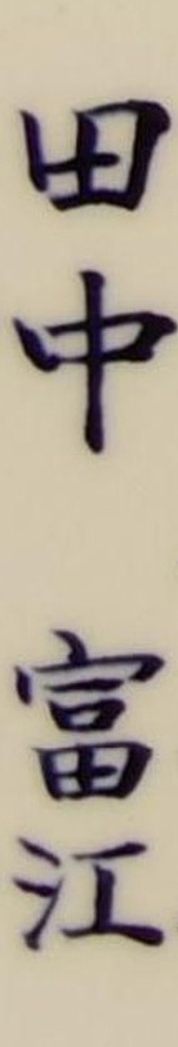田中富江
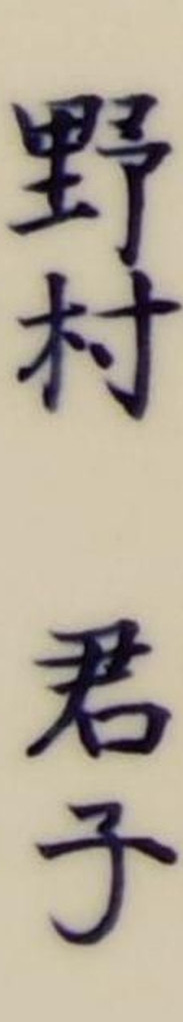野村君子
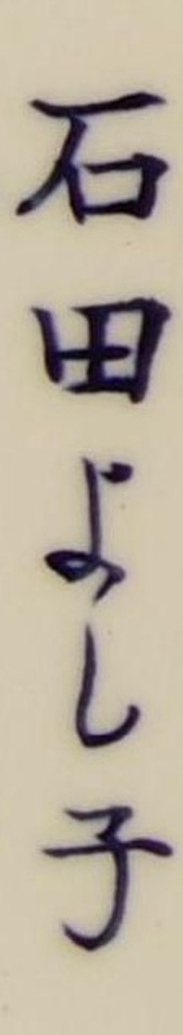石田よし子
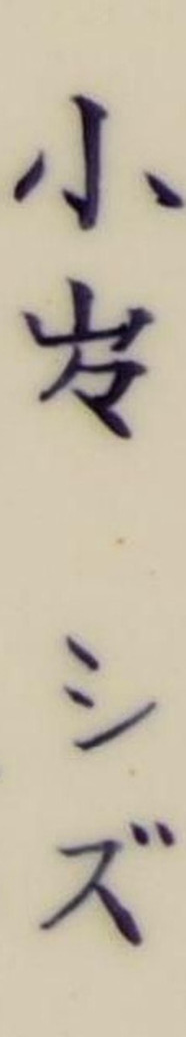小出シズ
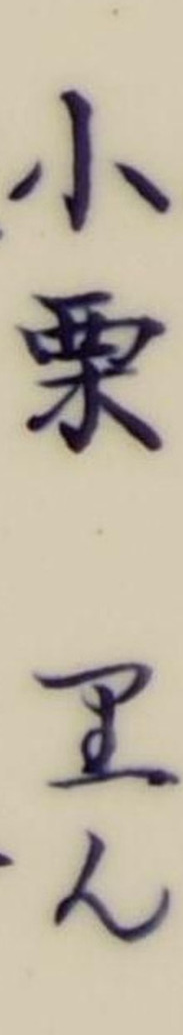小栗りん
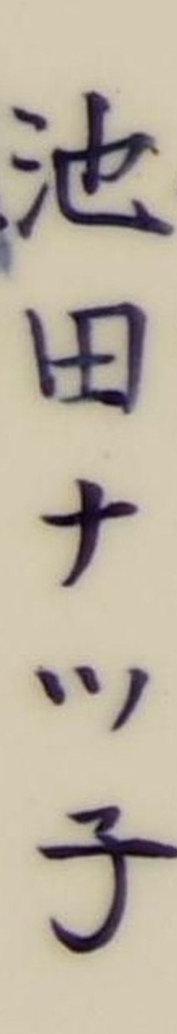池田ナツ子
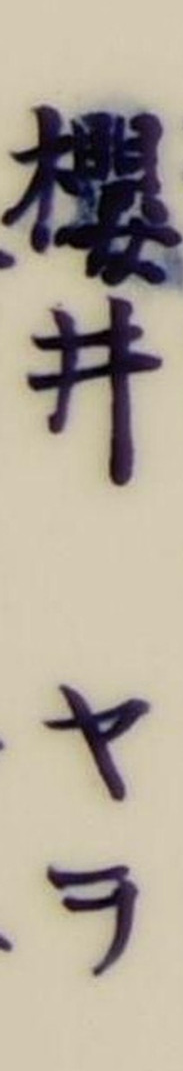桜井ヤヲ
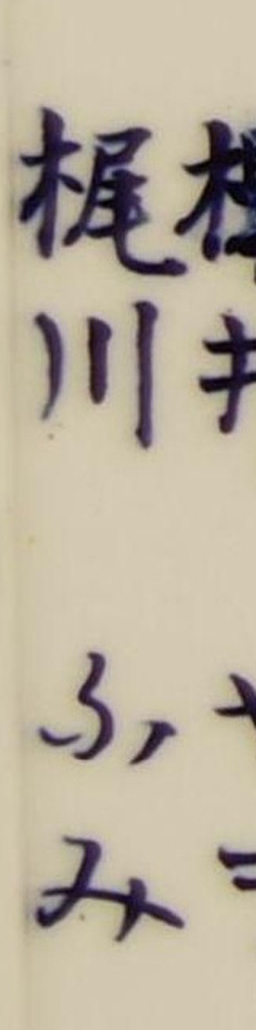梶川ふみ

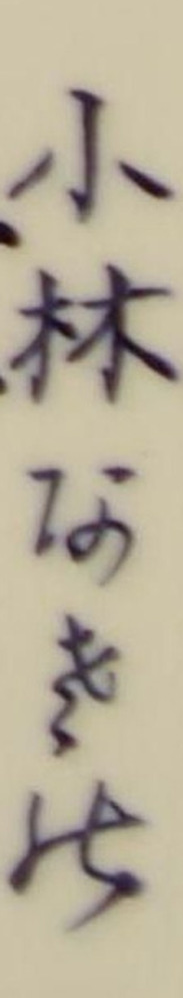小林あさの
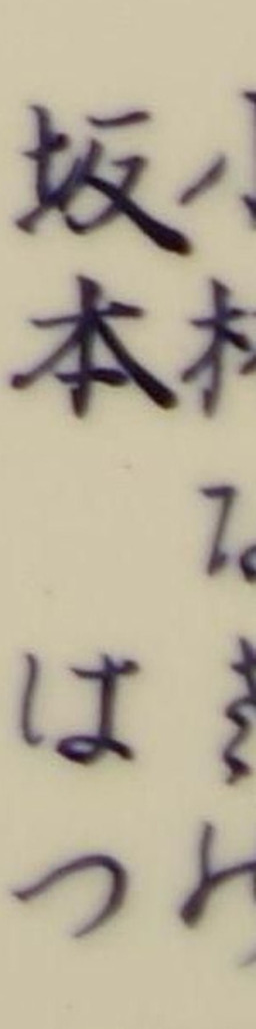坂本はつ
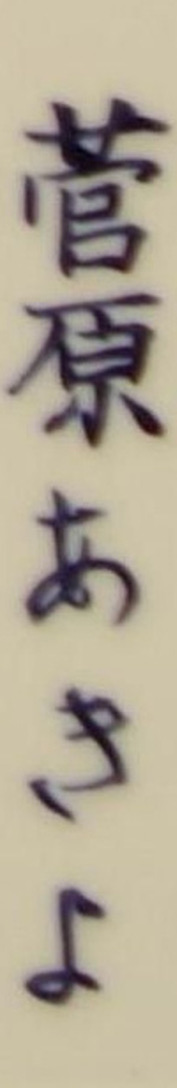菅原あきよ
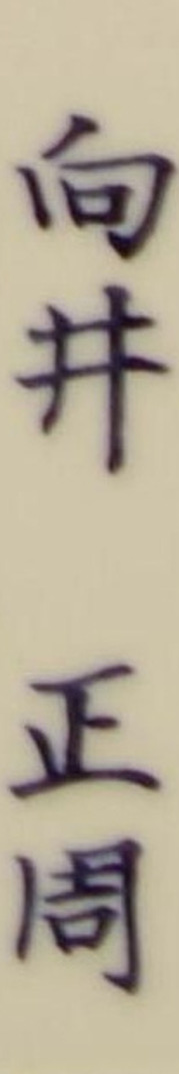向井正周
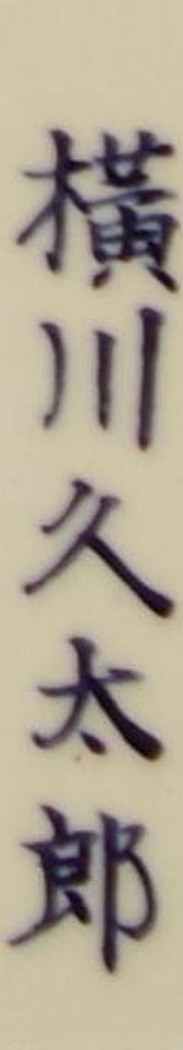横川久太郎
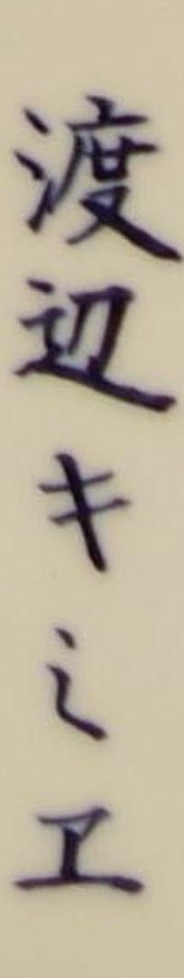渡辺キミヱ
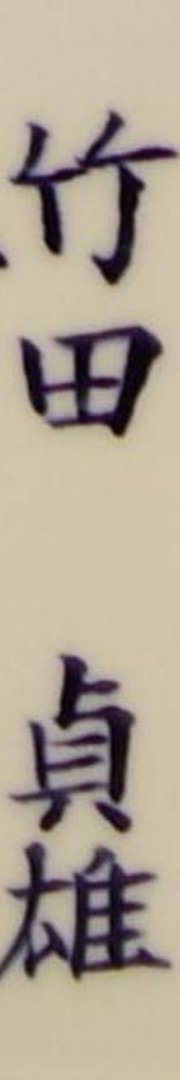竹田貞雄
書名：E~L
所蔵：高野山金剛峯寺
